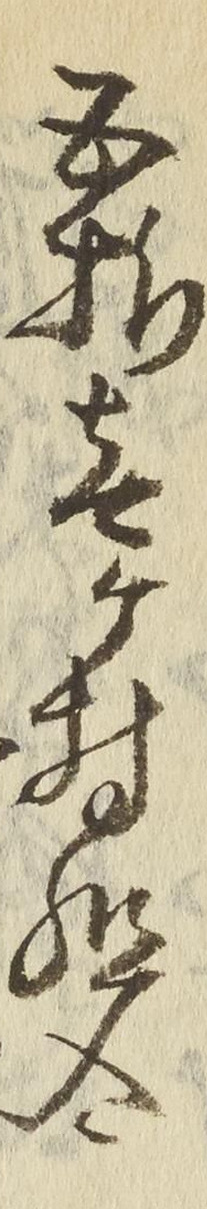五拾壱ヶ村組合
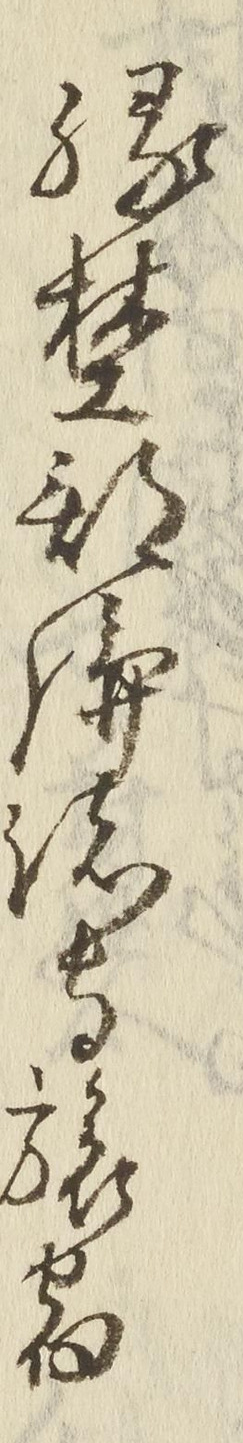縁埜郡浄法寺旅宿
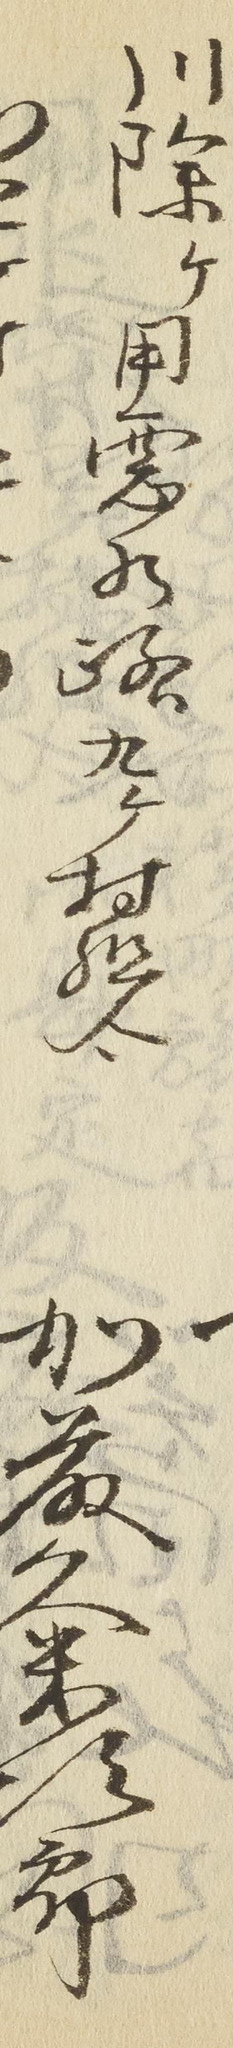川除ヶ用悪水路九ヶ村組合加藤久米治郎
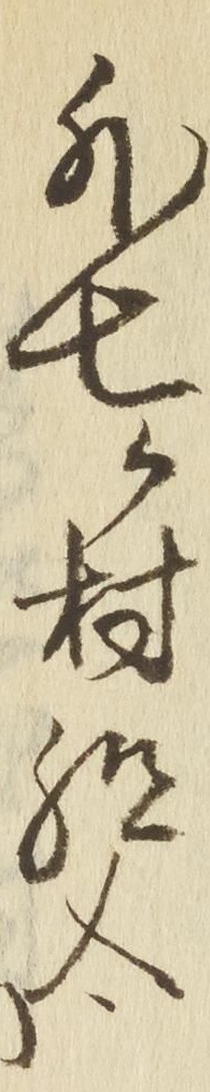外九ヶ村組合
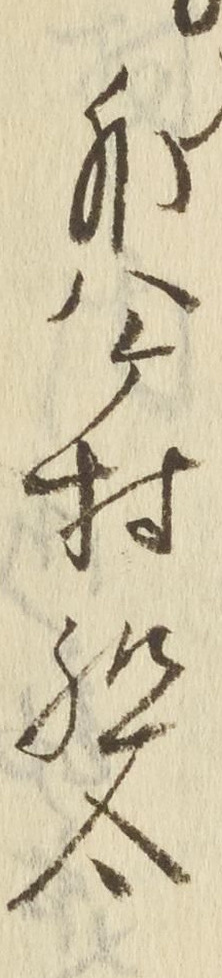外九ヶ村組合
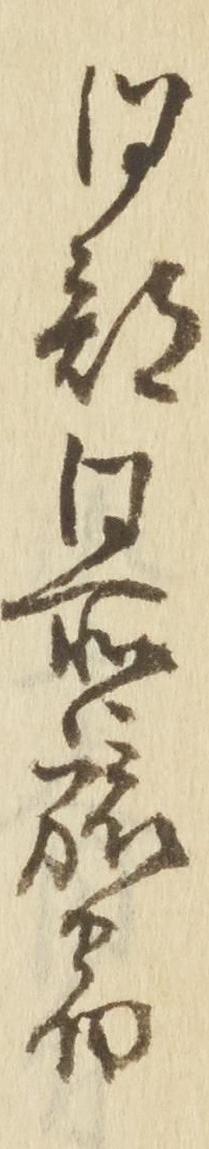同郡同所旅宿
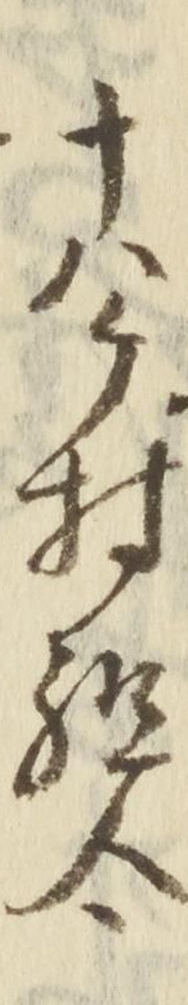外十六ヶ村組合
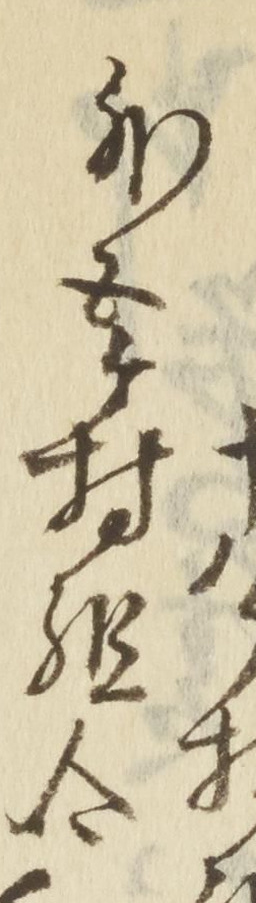外九ヶ村組合
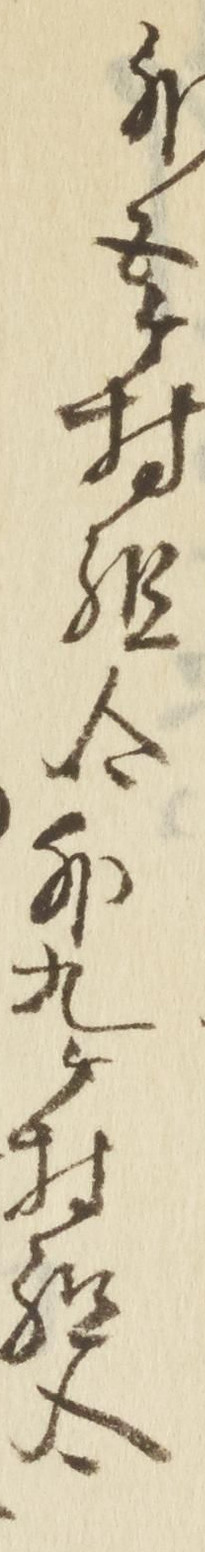三十ヶ村組合外三十三ヶ村組合
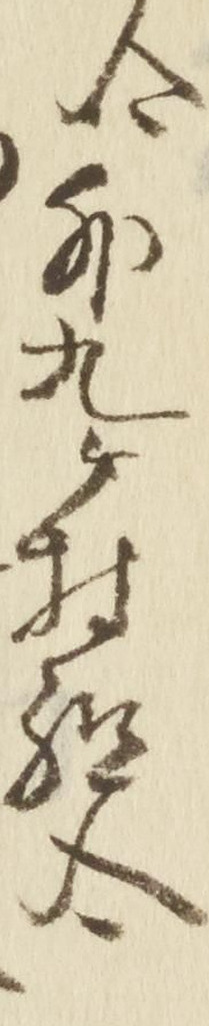外九ヶ村組合
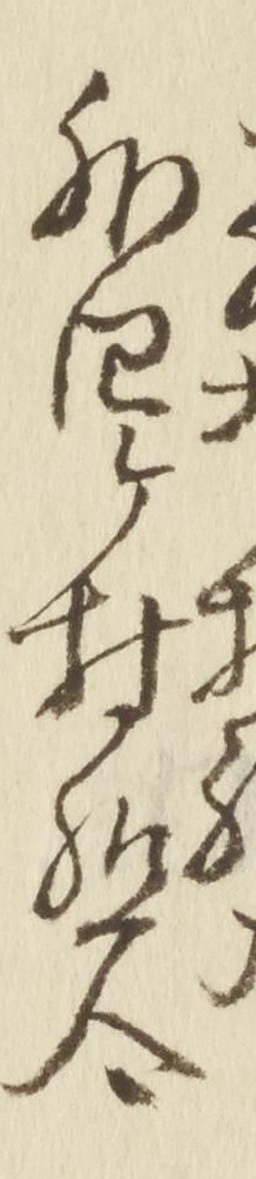外四ヶ村組合
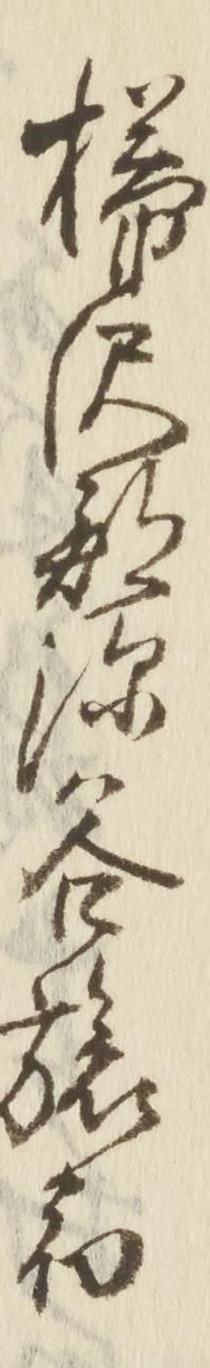榛沢郡深谷旅宿
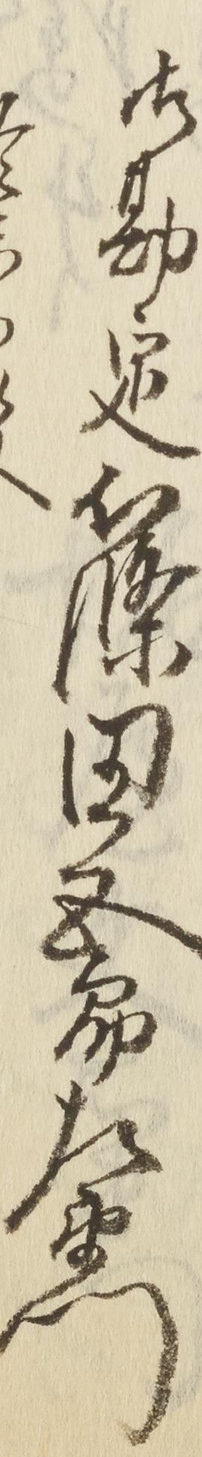御勘定條田五郎左衛門
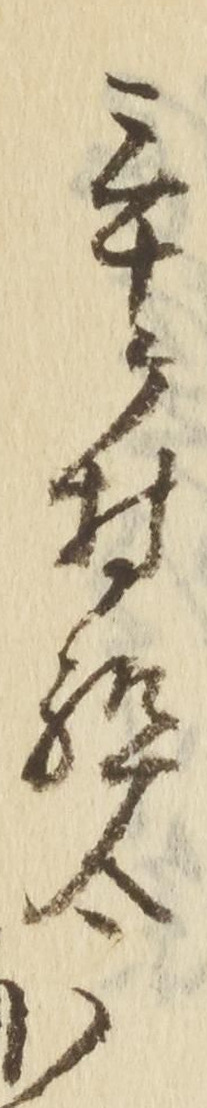外十六ヶ村組合
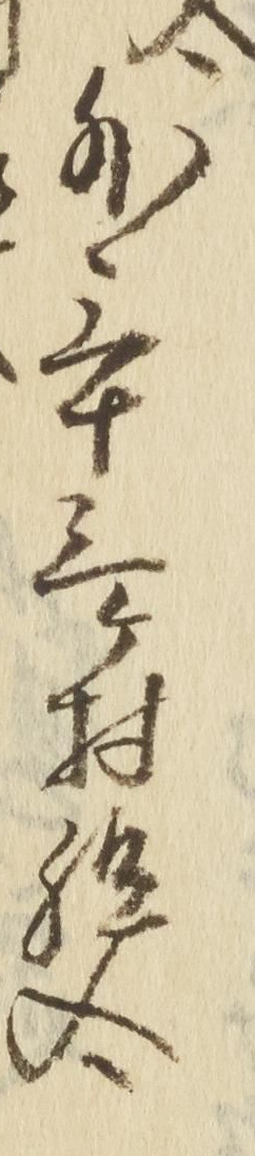外十六ヶ村組合
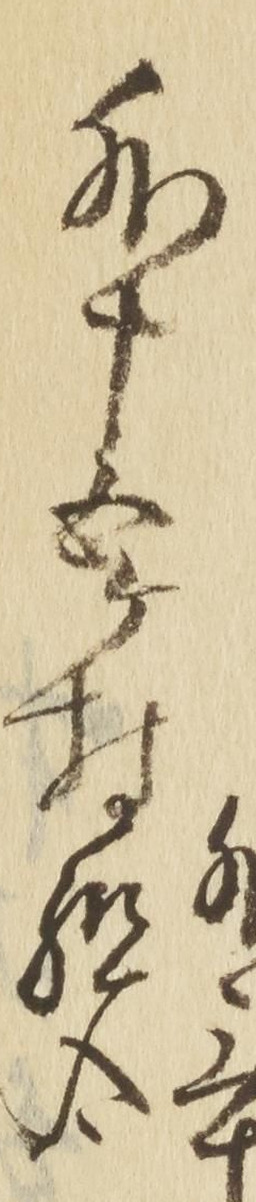外十六ヶ村組合
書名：浅間大變記
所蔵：東京大学地震研究所図書室 Earthquake Research Institute Library, The University of Tokyo, JAPAN
